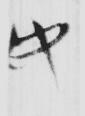女
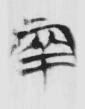兩
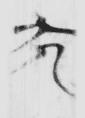犬
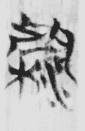{枼攴水}
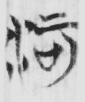河
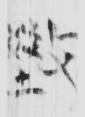{叕攴}
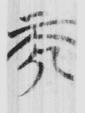而
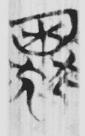{困㹜}
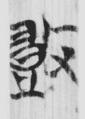敳
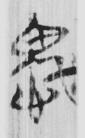{鬼心}
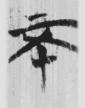不
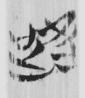{足欠}
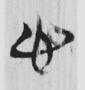心
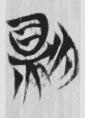則
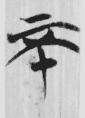不
